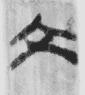文
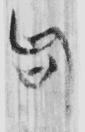句
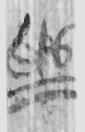爲
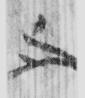之
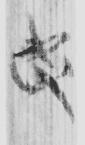奴
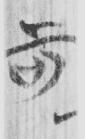可
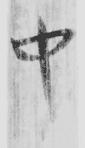中
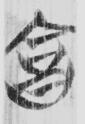合
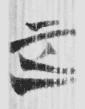正
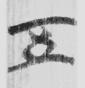五
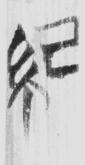紀
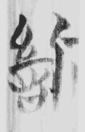{幺言斤}
